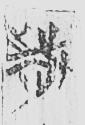歲
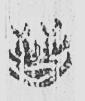晉
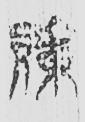{貝重}
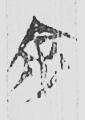余
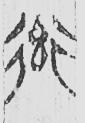率
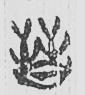晉
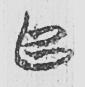𠂤
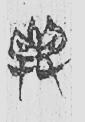與
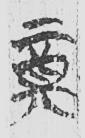奠
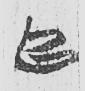𠂤
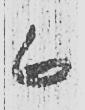㠯（以）
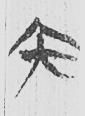內
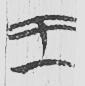王
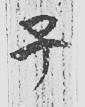子
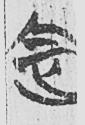定
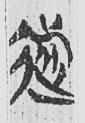{辶旅}
